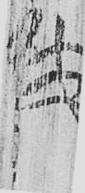隹（唯）
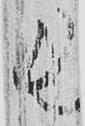心
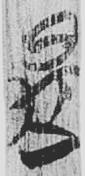是
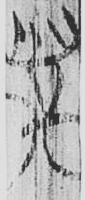萬（勵）
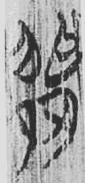○（間）
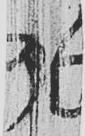○（關）
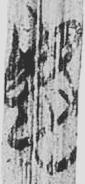○（謀）
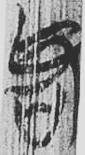司（治）
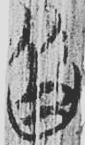皆（偕）
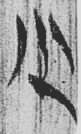少
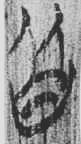皆（偕）
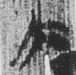大
